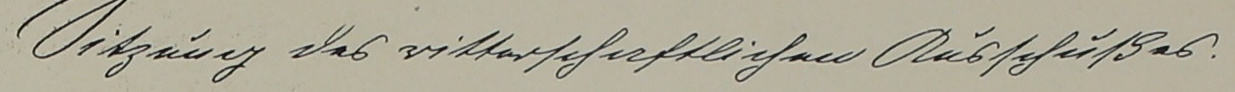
Sitzung des ritterschaftlichen Ausschußes.
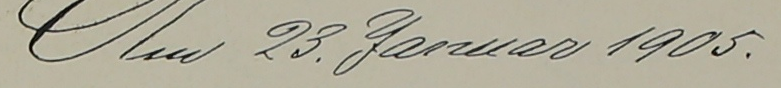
Am 23. Januar 1905.
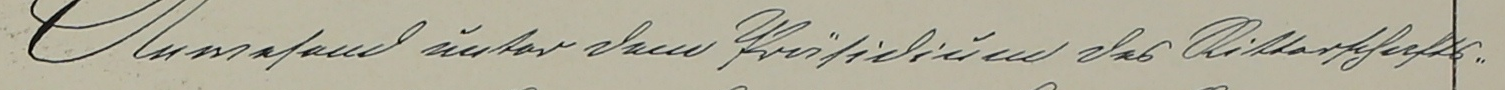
Anwesend unter dem Präsidium des Ritterschafts-
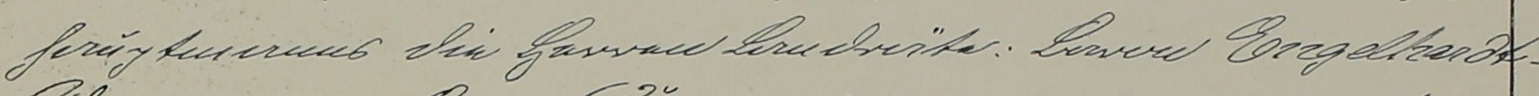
hauptmanns die Herren Landräte: Baron Engelhardt-
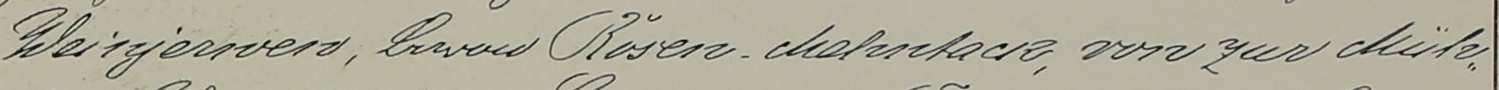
Weinjerwen, Baron Rosen-Mehntack, von zur Müh-
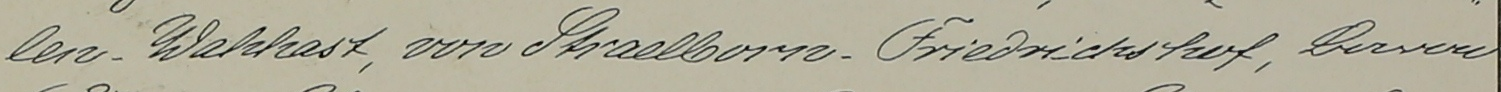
len-Wahhast, von Straelborn-Friedrichshof, Baron
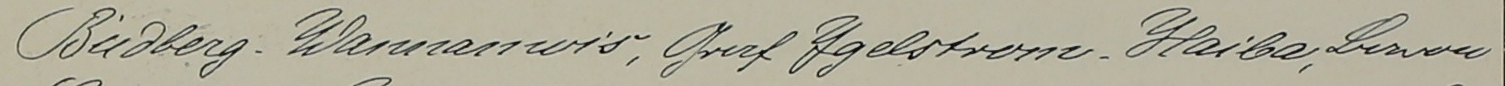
Budberg-Wannamois, Graf Igelstrom-Haiba, Baron
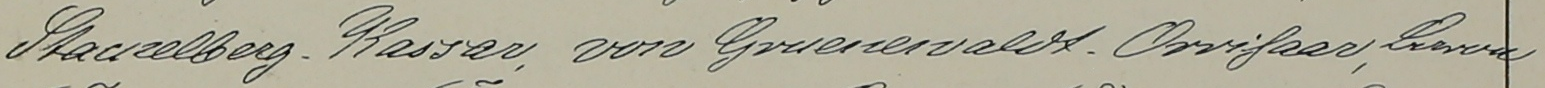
Stackelberg-Kassar, von Gruenewaldt-Orrisaar, Baron
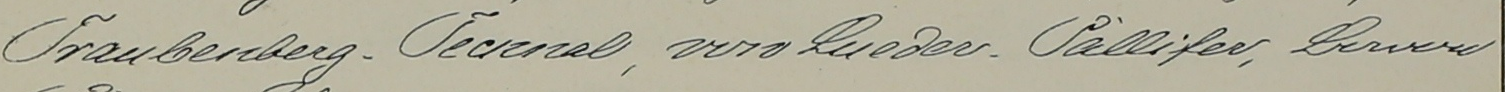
Traubenberg-Tecknal, von Lueder-Pallifer, Baron
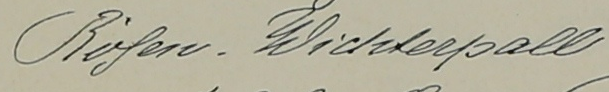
Rosen-Wichterpall
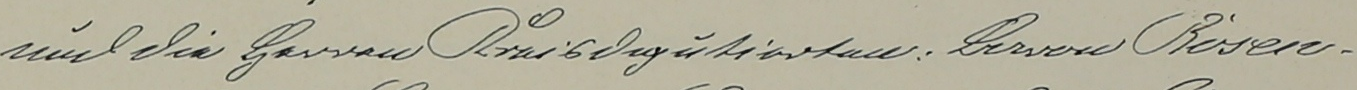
und die Herren Kreisdeputierten: Baron Rosen-
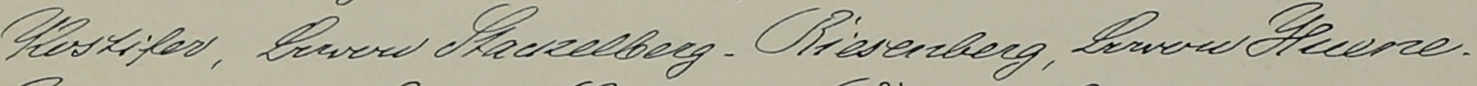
Kostifer, Baron Stackelberg-Riesenberg, Baron Huene-
